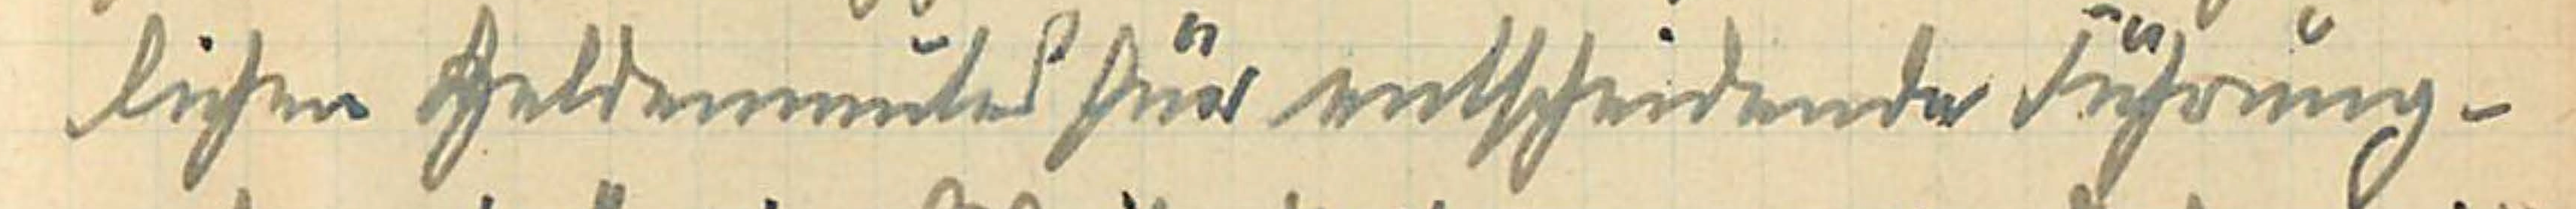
lichen Heldenmutes für entscheidende Führung –
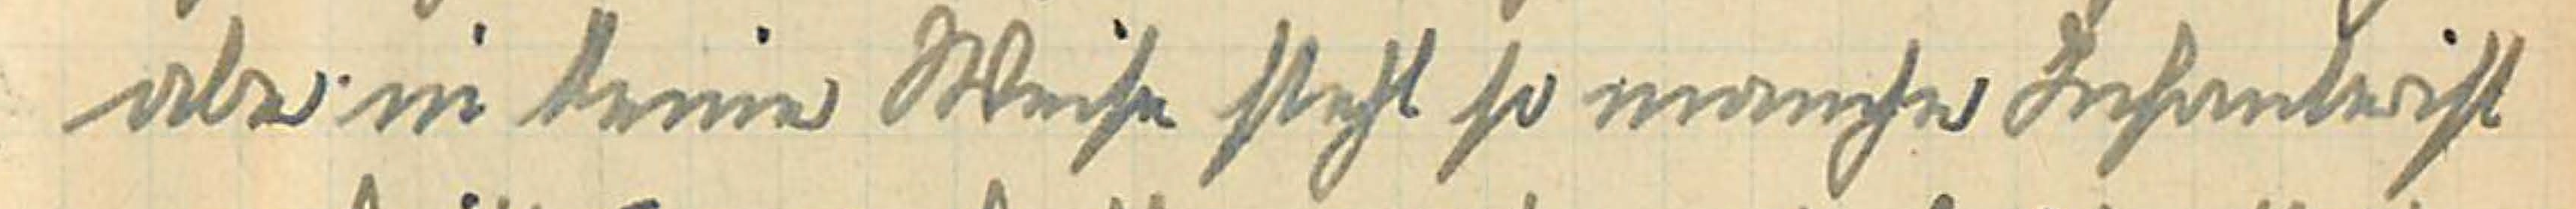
aber in keiner Weise steht so mancher Infanterist
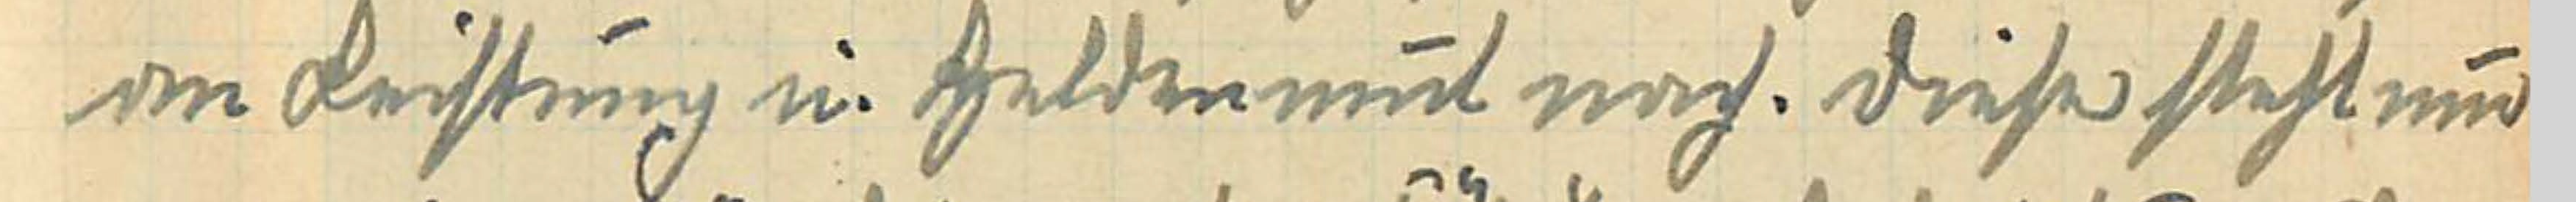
an Leistung u. Heldenmut nach. Dieser steht nur
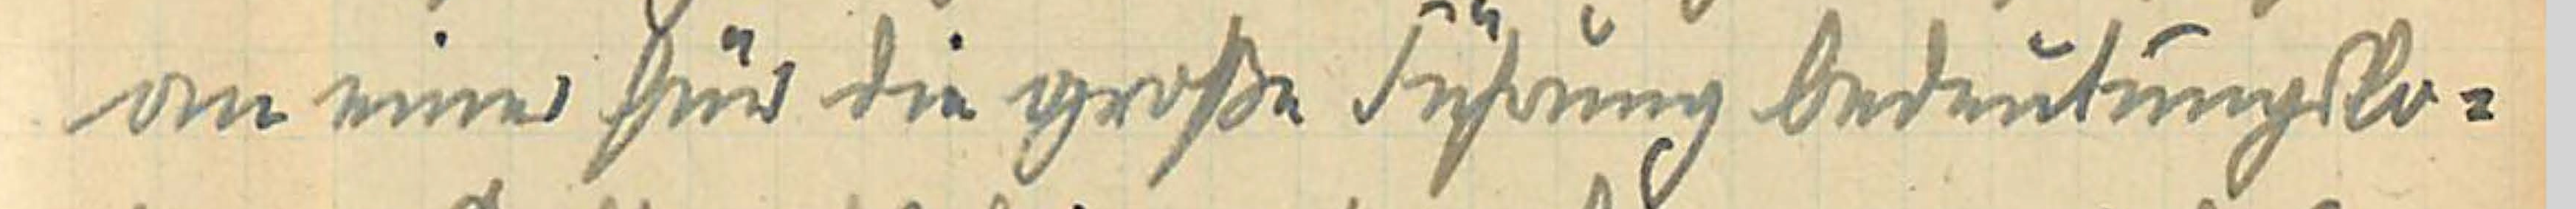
an einer für die große Führung bedeutungslo-
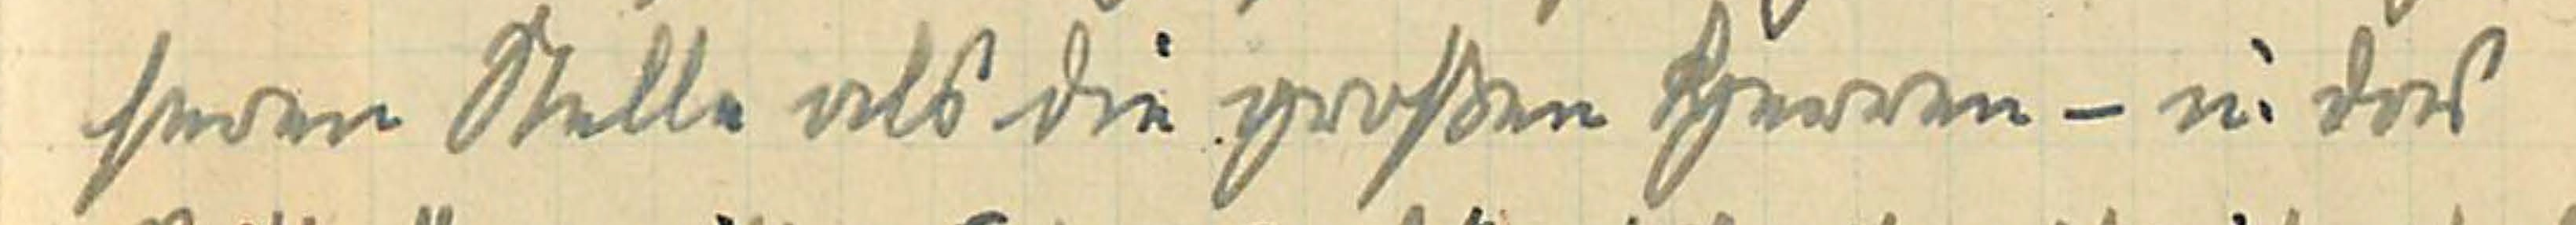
seren Stelle als die großen Herren – u. das
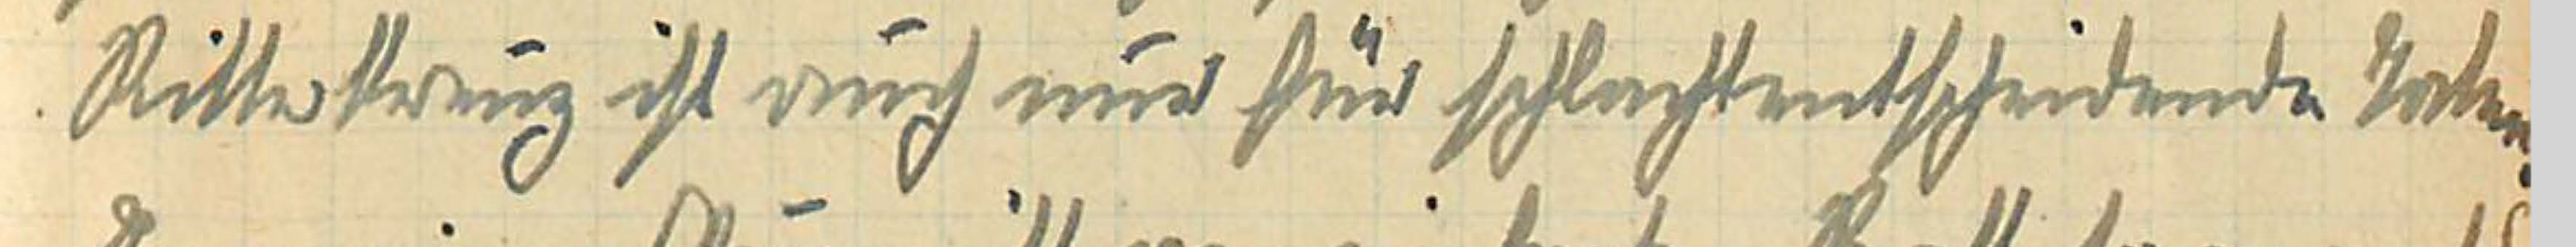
Ritterkreuz ist auch nur für schlachtentscheidende Taten.
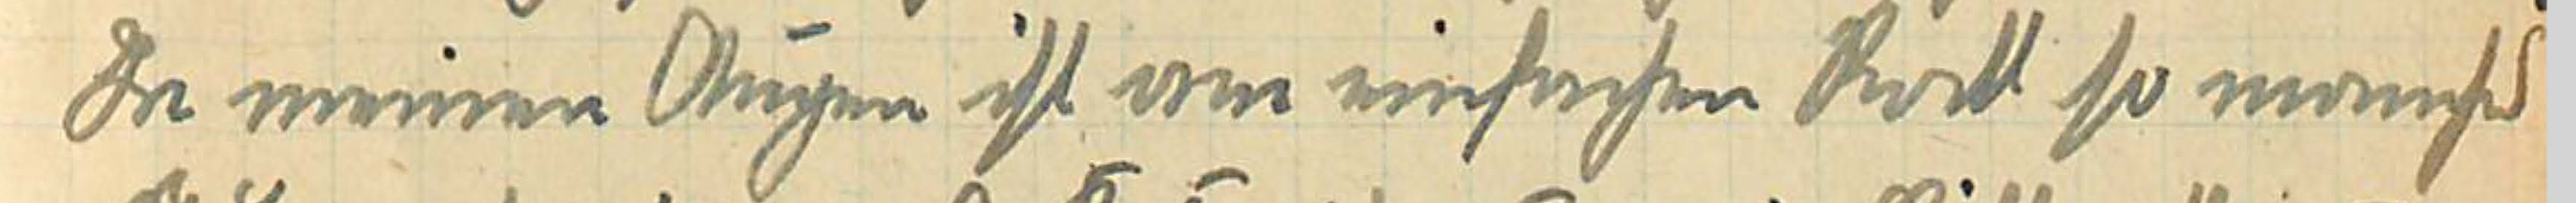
In meinen Augen ist am einfachen Rock so manches
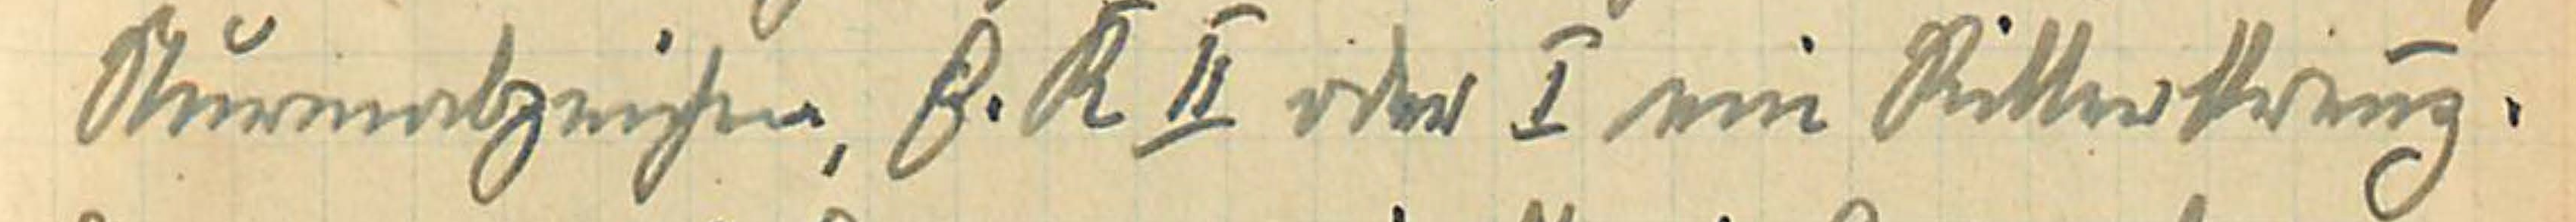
Sturmabzeichen, E.K II oder I ein Ritterkreuz.
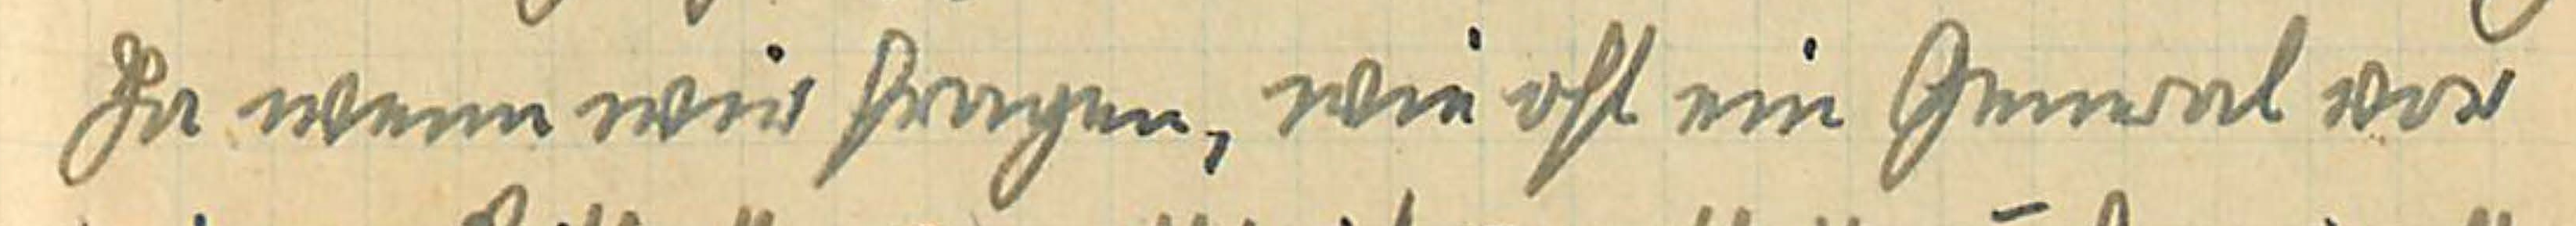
Ja wenn wir fragen, wie oft ein General vor
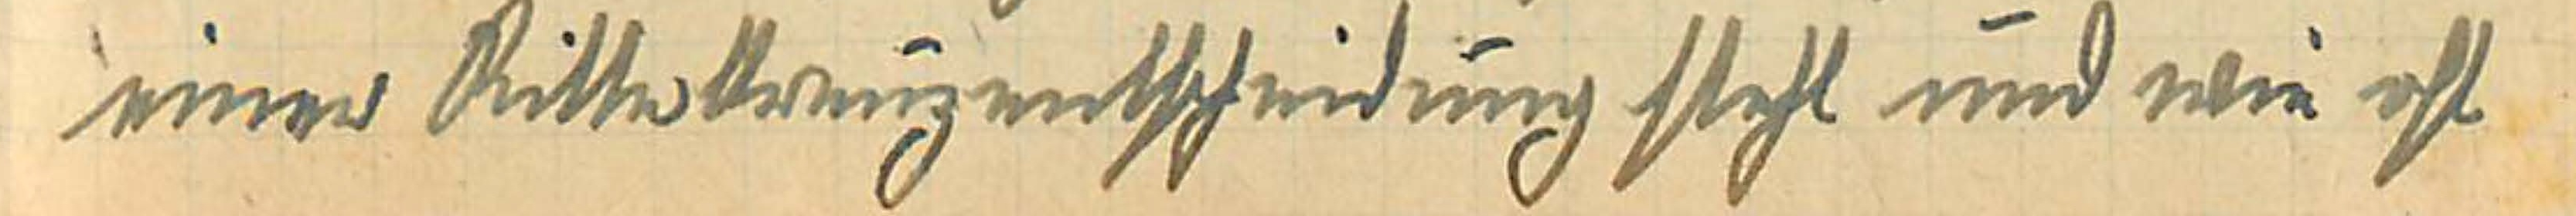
einer Ritterkreuzentscheidung steht und wie oft
